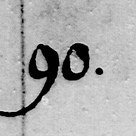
50.
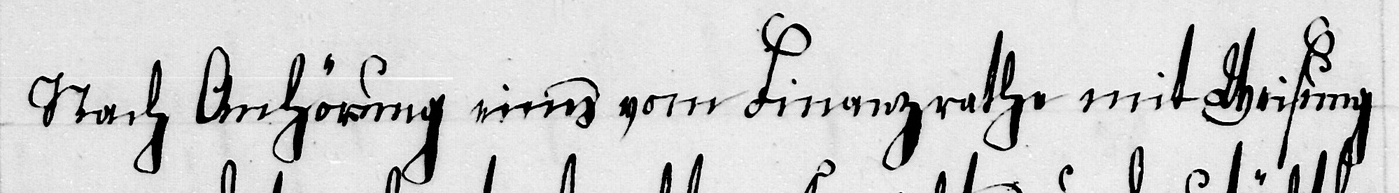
Nach Anhörung eines vom Finanzrathe mit Weisung
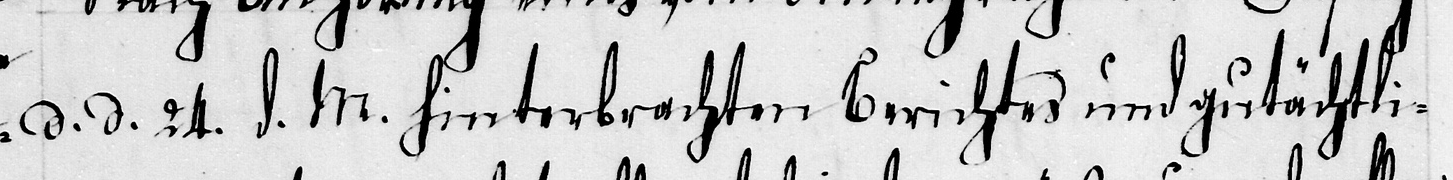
d. d. 24. d. M. hinterbrachten Berichtes und gutächtli¬
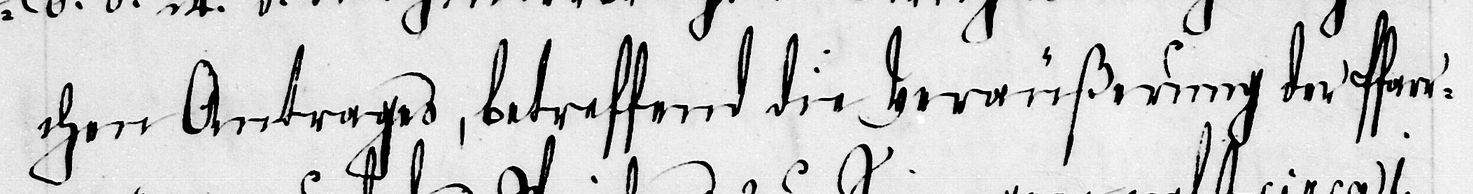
chen Antrages, betreffend die Veräußerung der Pfar¬
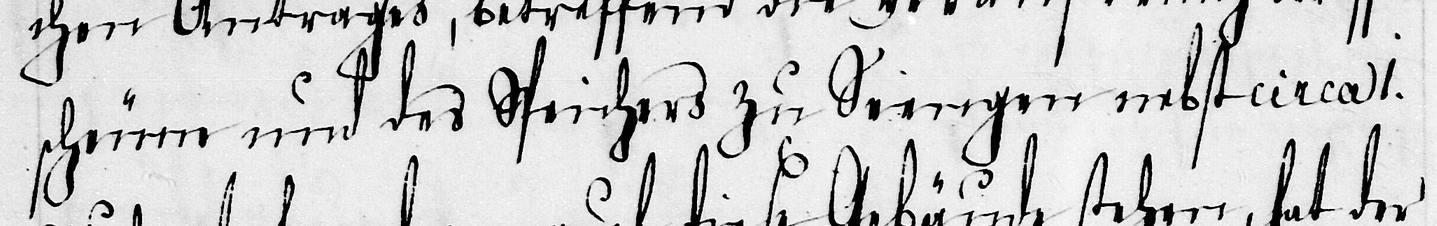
rscheune und des Speichers zu Seengen nebst circa 1.
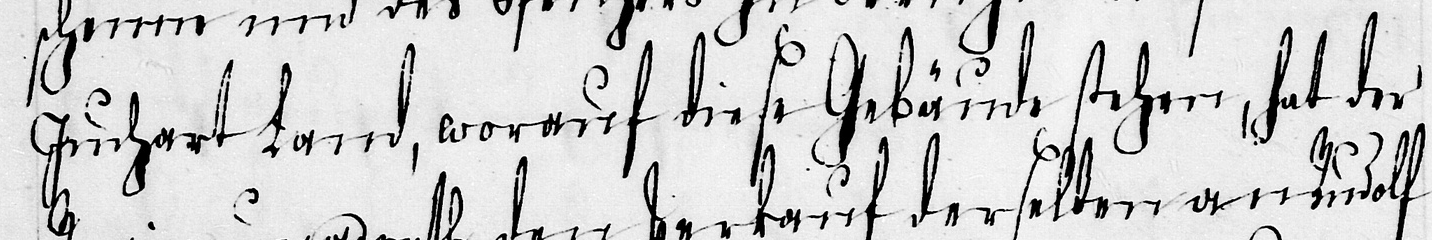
Juchart Land, worauf diese Gebäude stehen, hat der
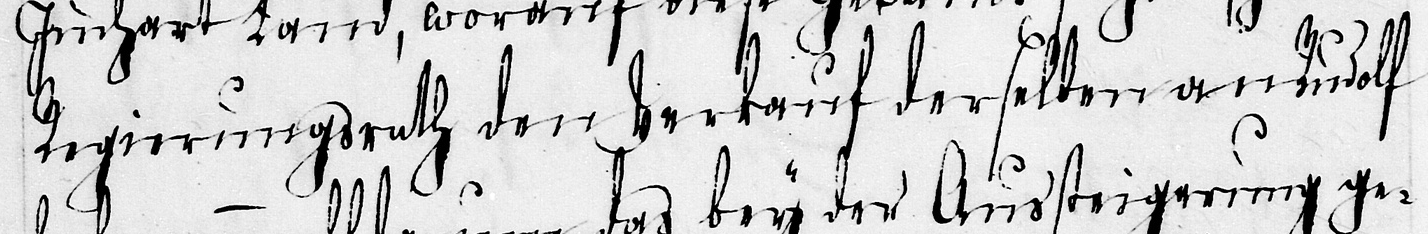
Regierungsrath den Verkauf derselben an Rudolf
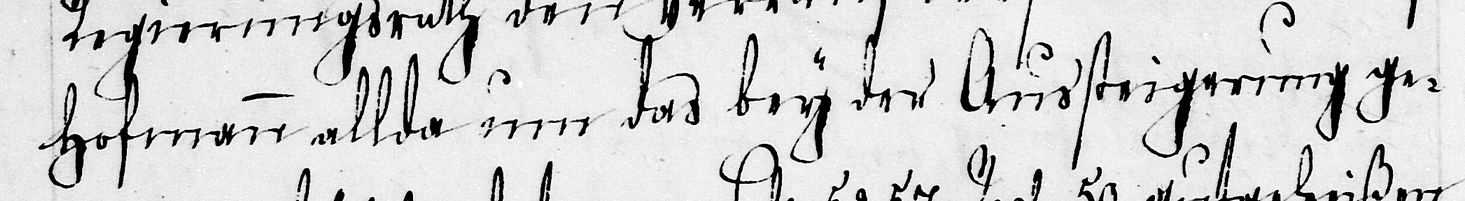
Hofmann allda um das bey der Aussteigerung ge¬
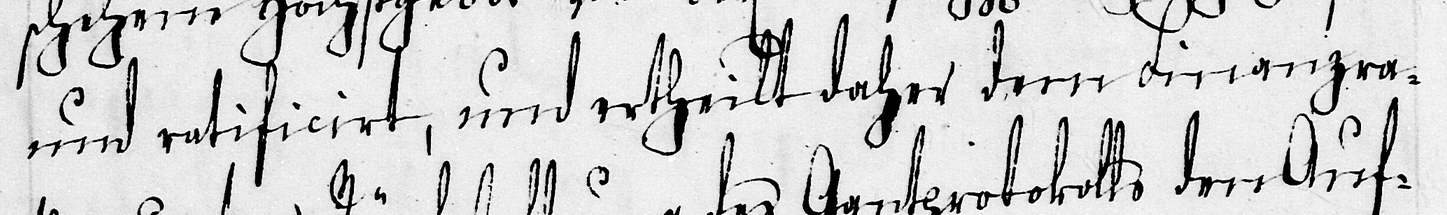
und ratificirt, und ertheilt daher dem Finanzra¬
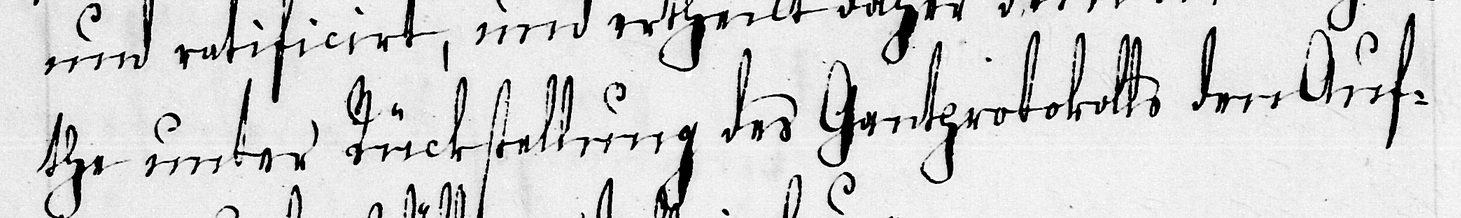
the unter Rückstellung des Gantprotokolls den Auf¬
